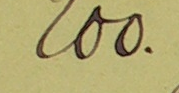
200
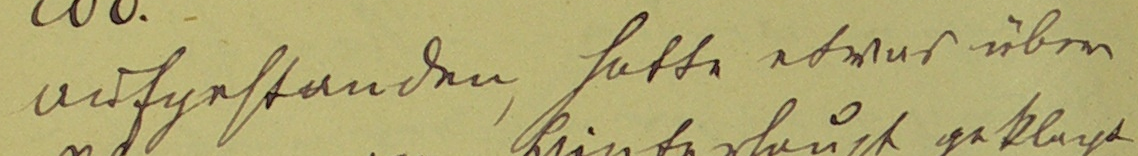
aufgestanden, hatte etwas über
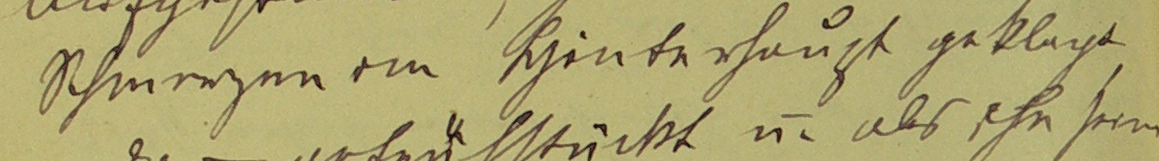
Schmerzen im Hinterhaupt geklagt
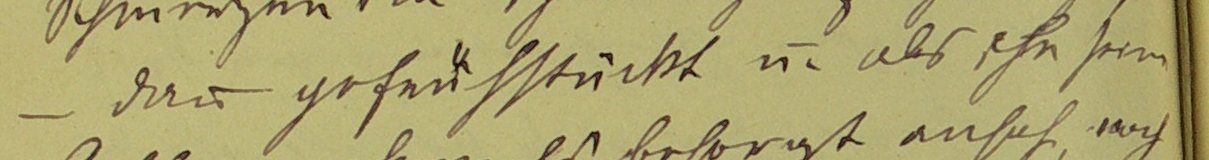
- dann gefrühstückt und als ihn seine
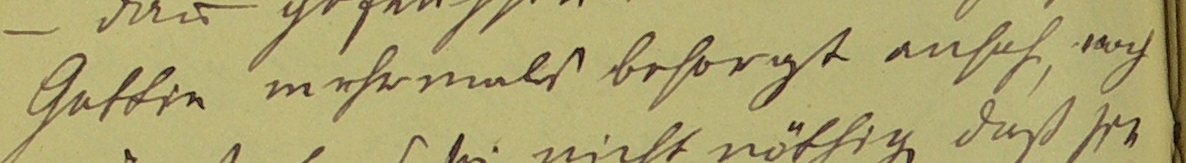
Gattin mehrmals besorgt ansah noch
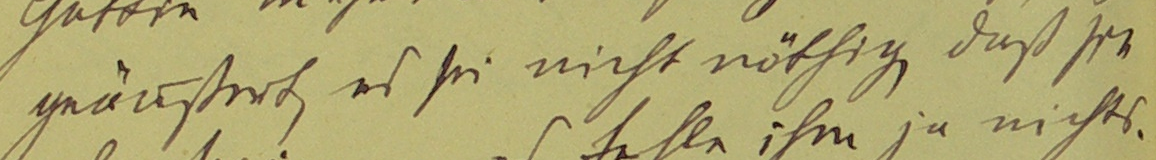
geäußert , es sei nicht nöthig, daß sie
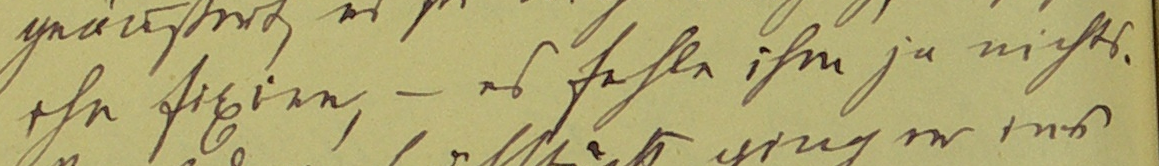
ihn fixiere,--es fehle ihm ja nichts.-
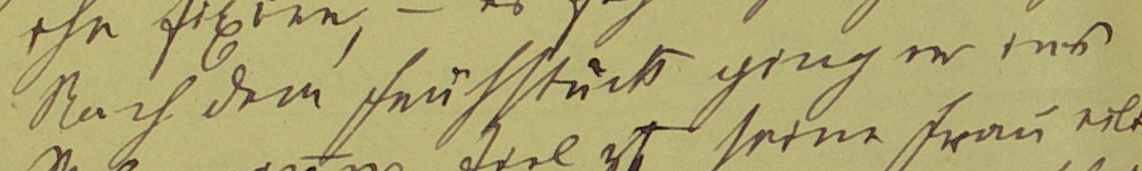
Nach dem Frühstück ging er ins
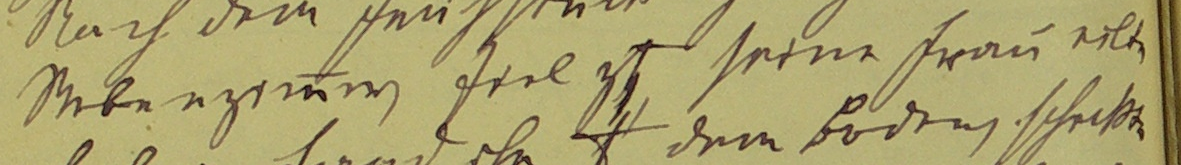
Nebenzimmer fiel zusammen, seine Frau eilte
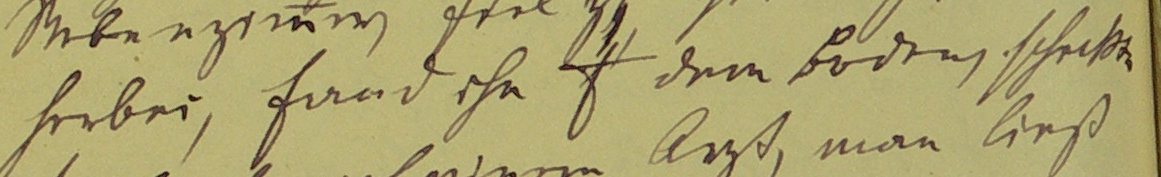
herbei, fand ihn auf dem Boden , schickte
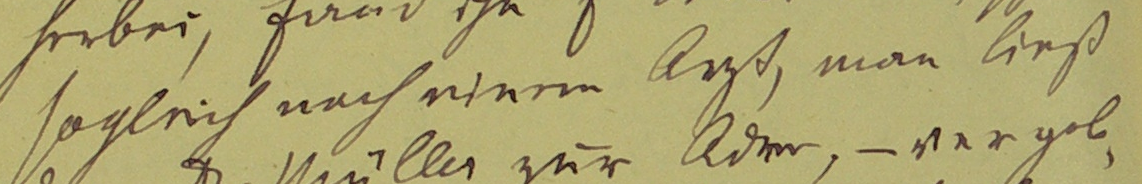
sogleich nach einem Arzt, man ließ
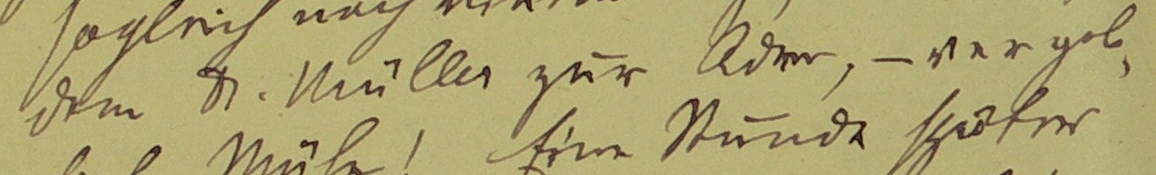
dann Dr. Müller zur Ader,- -vergeb¬
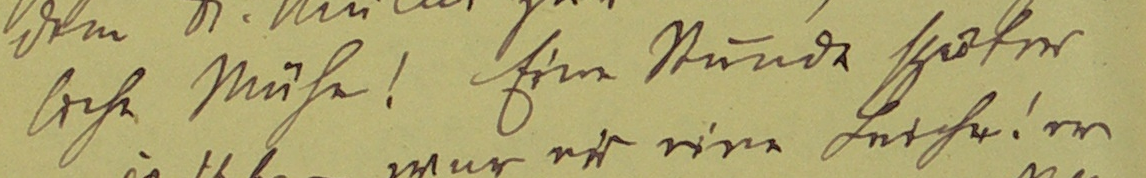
liche Mühe! – Eine Stunde später so
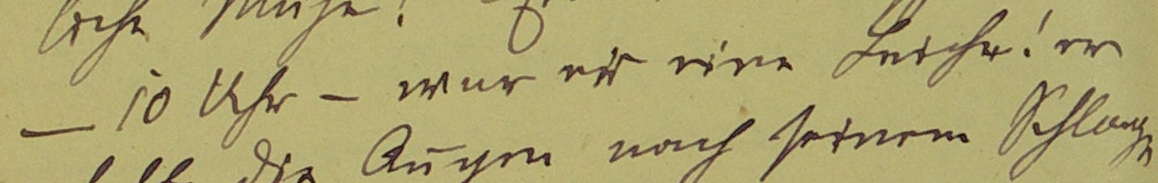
- 10 Uhr – wurde er eine Leiche ! Er
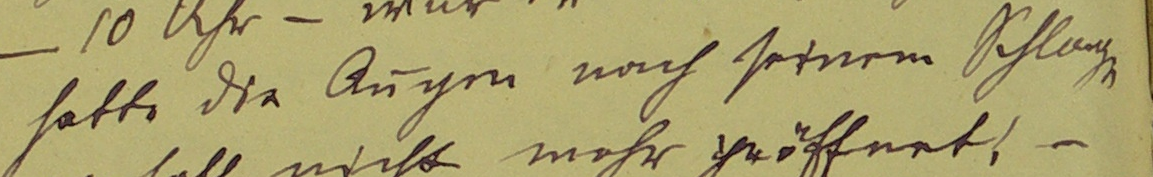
hatte die Augen nach seinem Schlag¬
